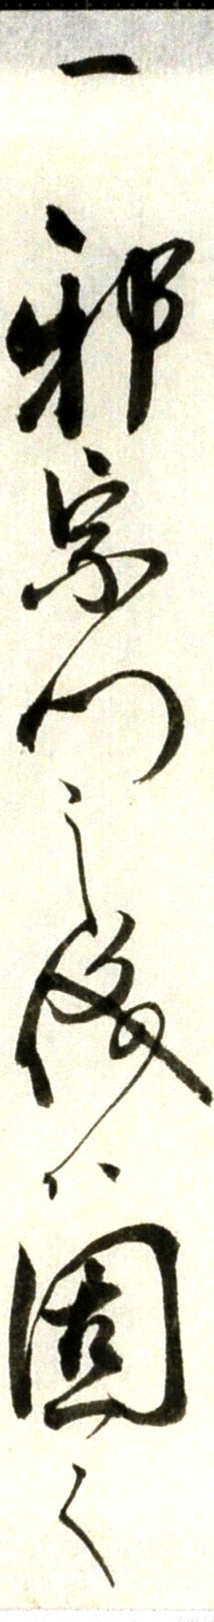一邪宗門之儀ハ固く
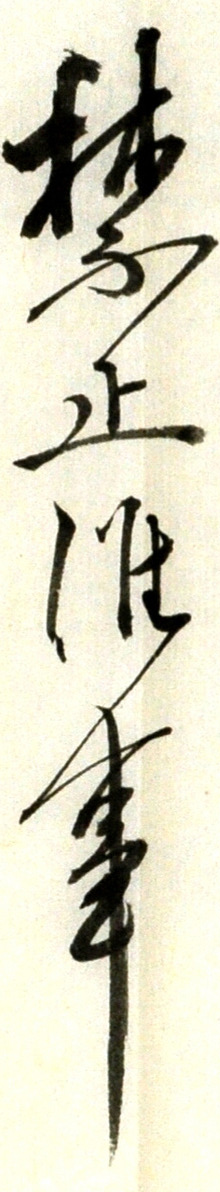禁止推事
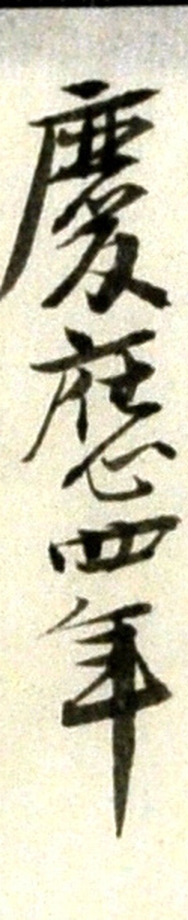慶應四年
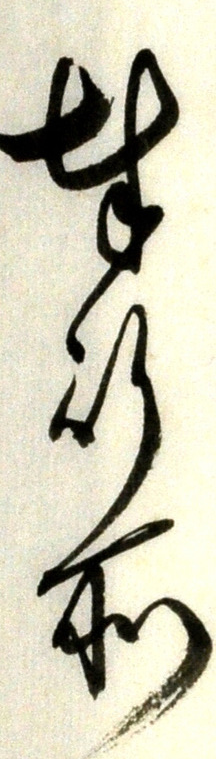奉行所

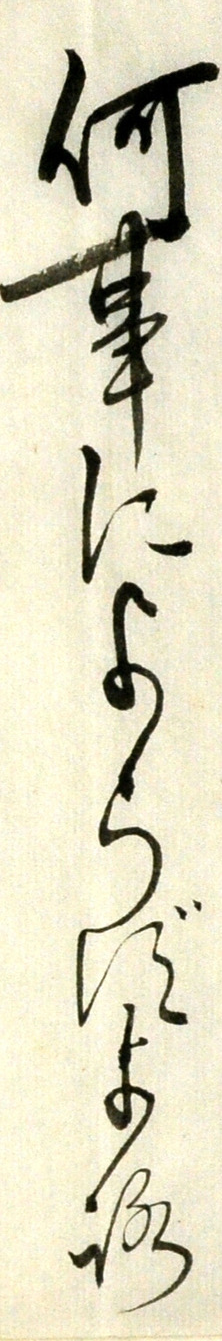何事によらずよろ
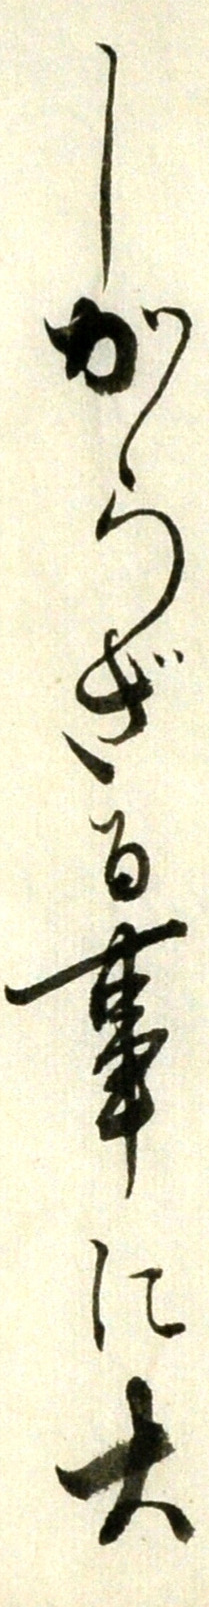しからざる事に大
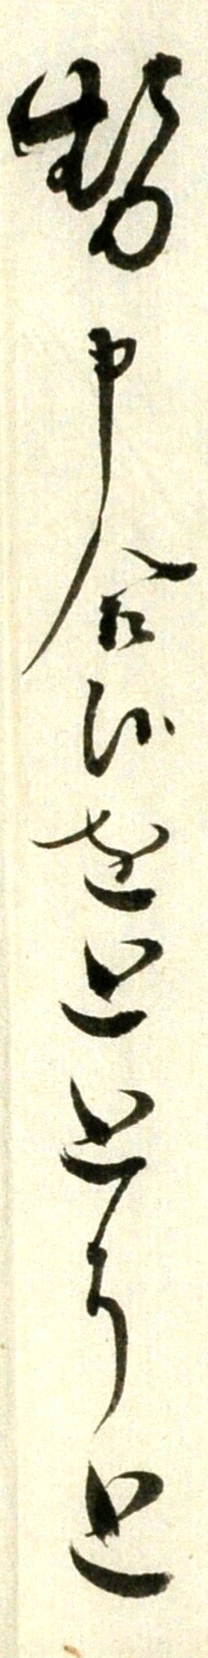勢申合候をととうと
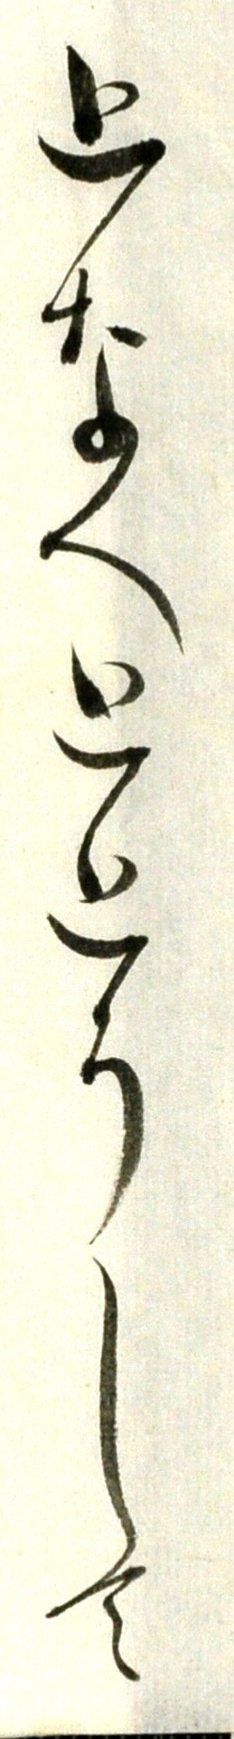となへととうして
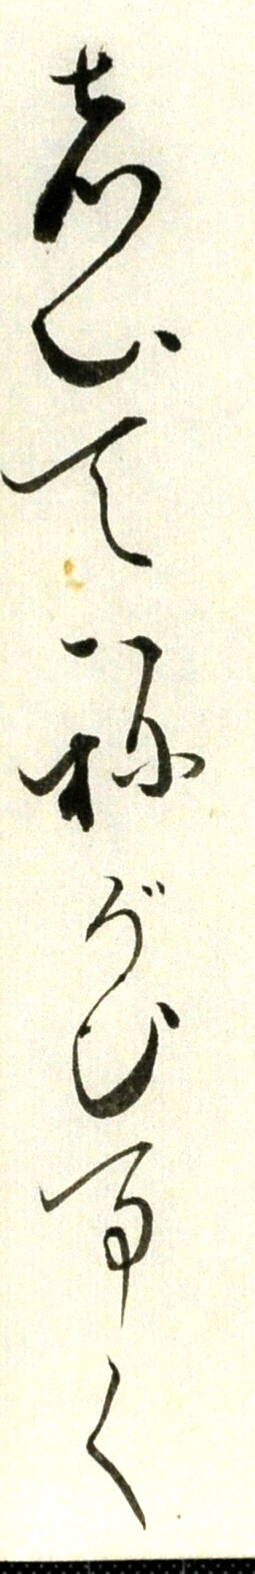しひてねがひ事く
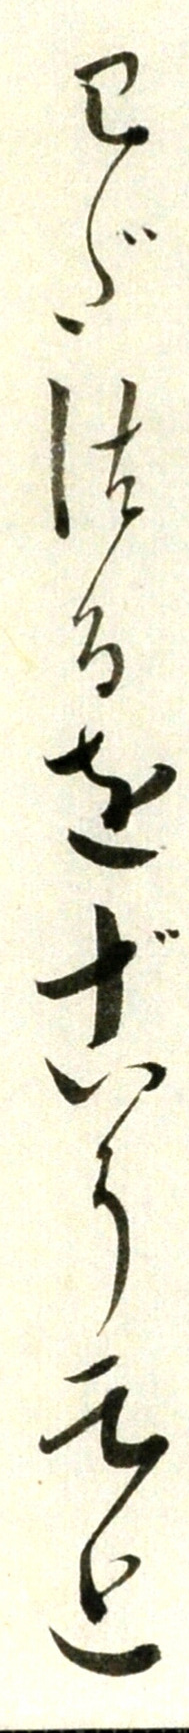はだつるをごうそと
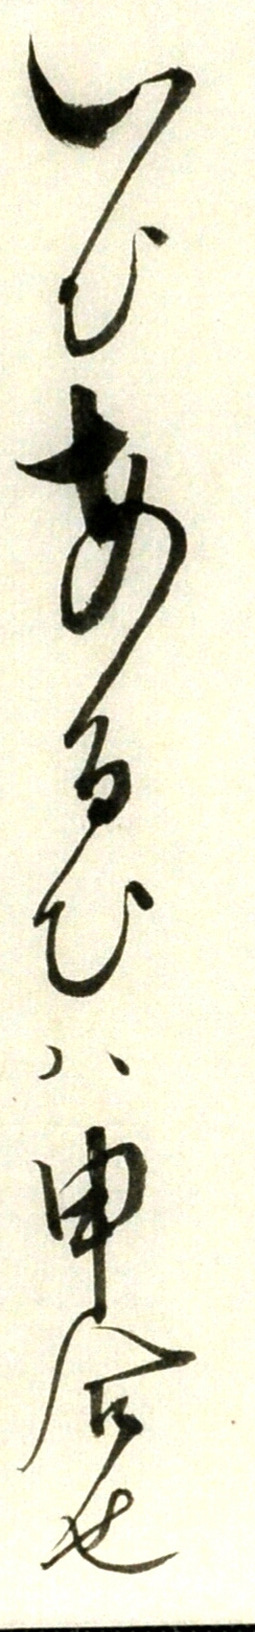いひあるひハ申合せ
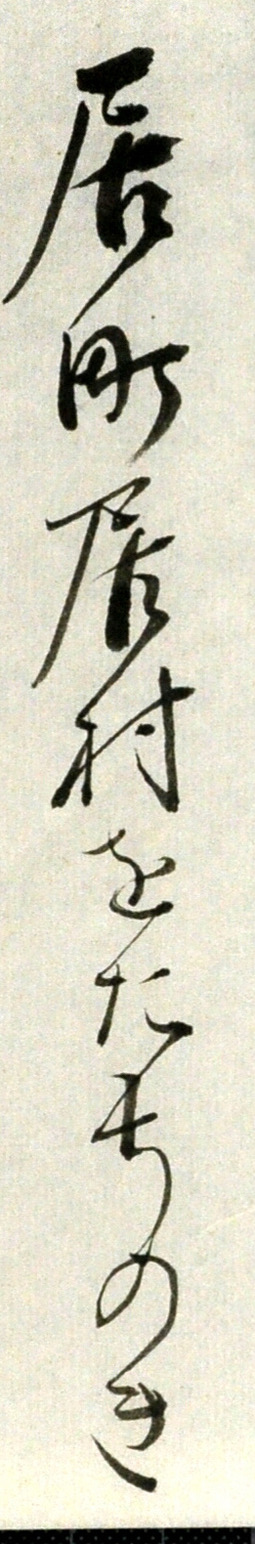居町居村をたちのき
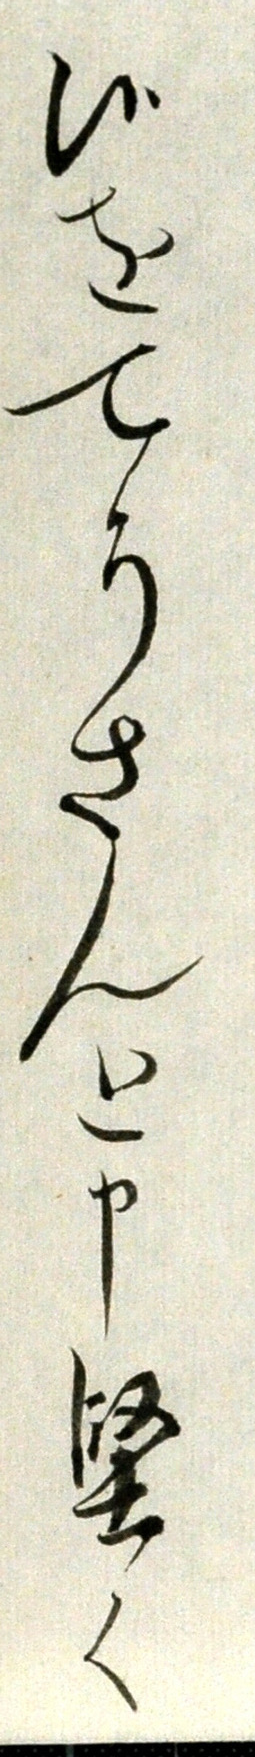候をてうさんと申堅く
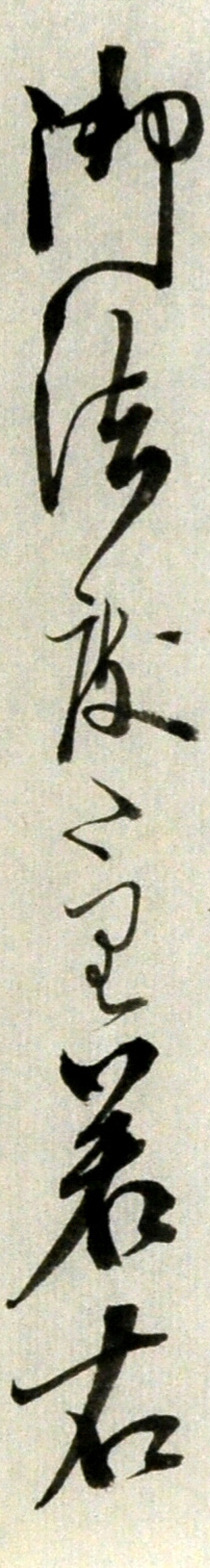御法度たり若右
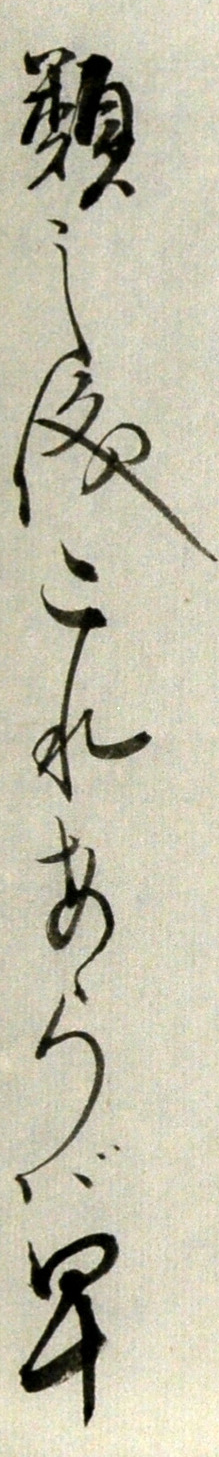類之儀これあらバ早

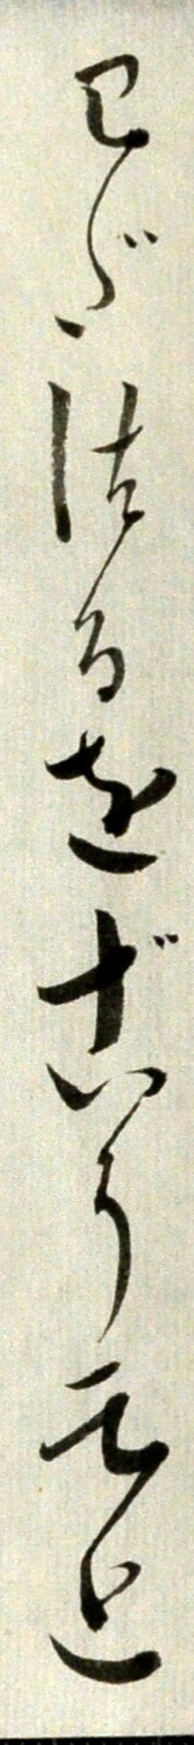はだつるをごうそと
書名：御高札之写
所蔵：伊那市立高遠町図書館・合同会社AMANE
